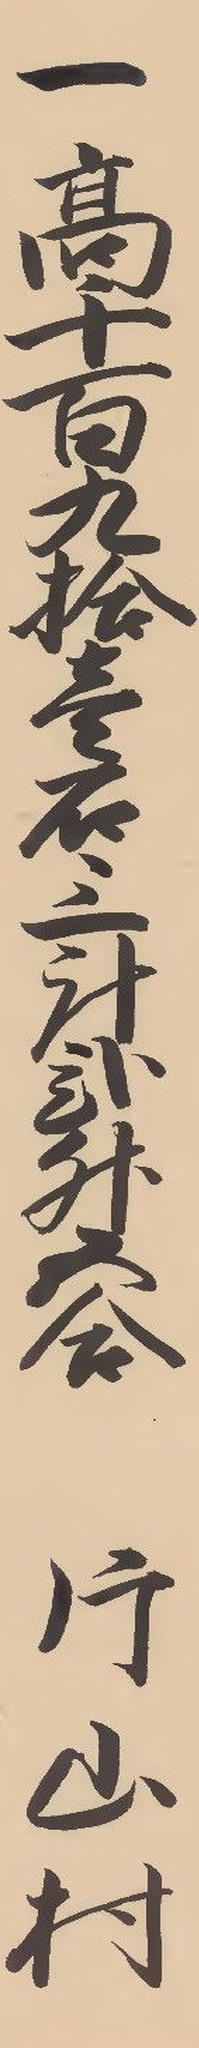一高千百九拾壱石三斗弐升五合片山村
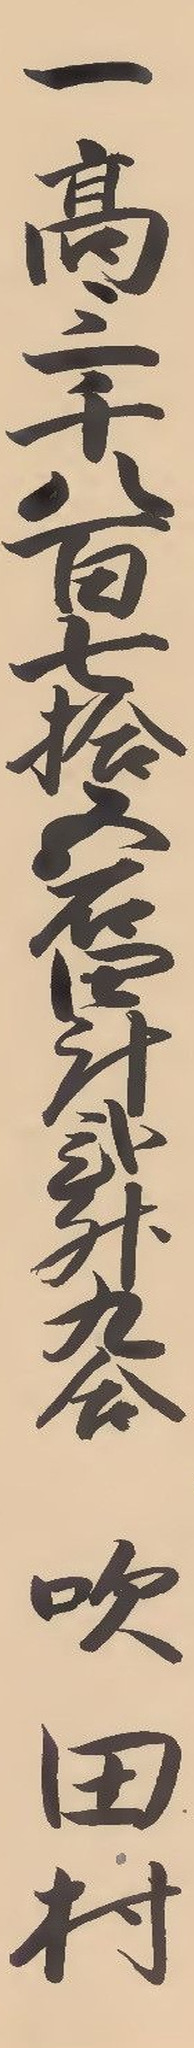一高三千八百七拾五石四斗弐升九合吹田村

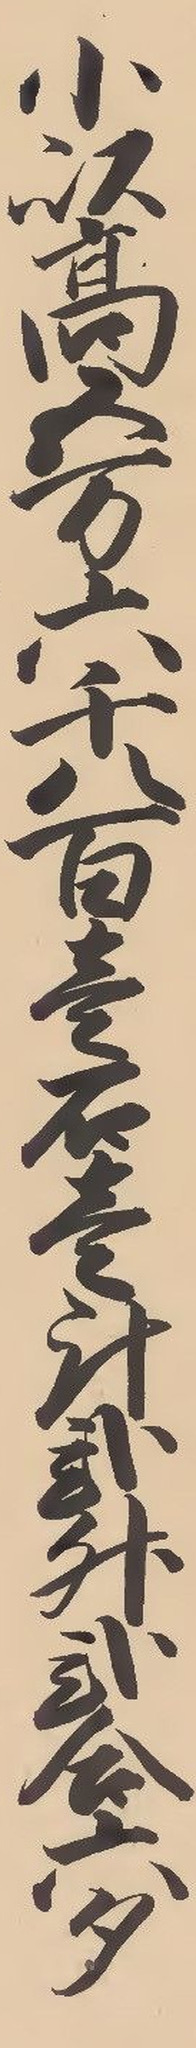小以高五万六千八百壱石壱斗弐升弐合六勺
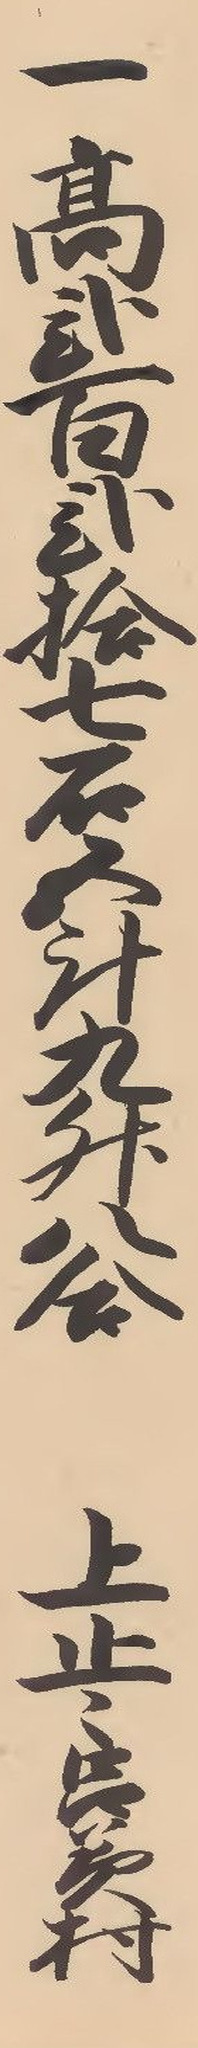一高弐百弐拾七石五斗九升八合上止々呂美村
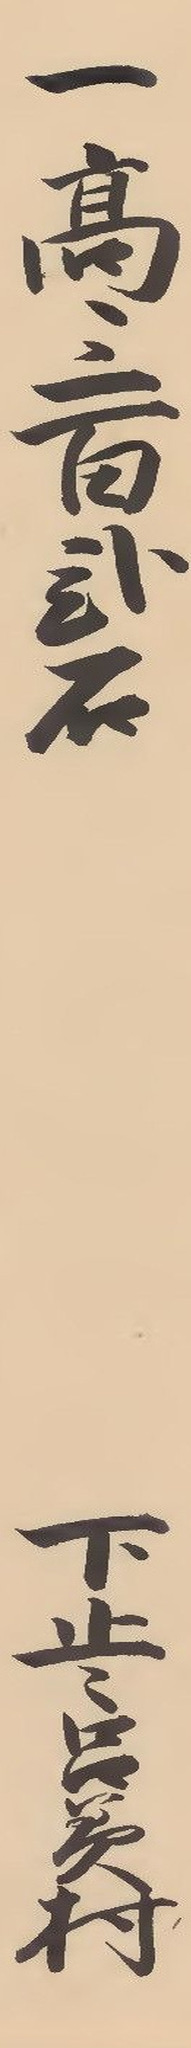一高三百弐石下止々呂美村
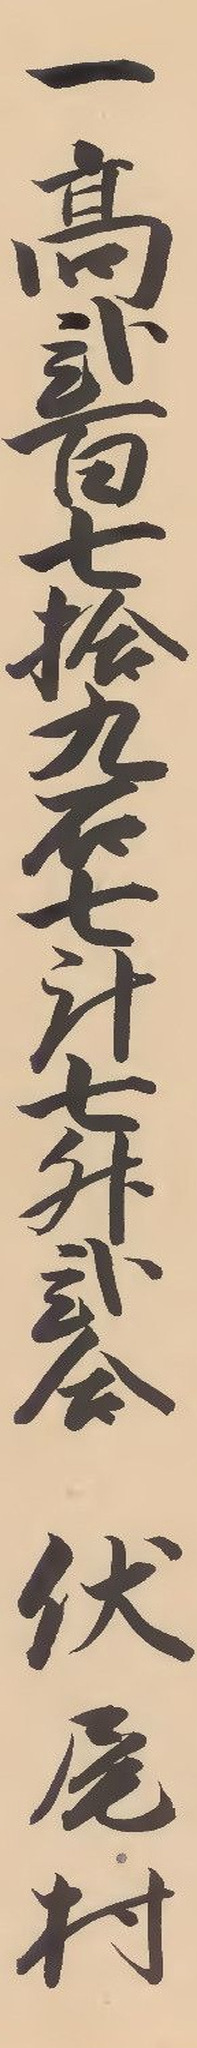一高弐百七拾九石七斗七升弐合伏尾村

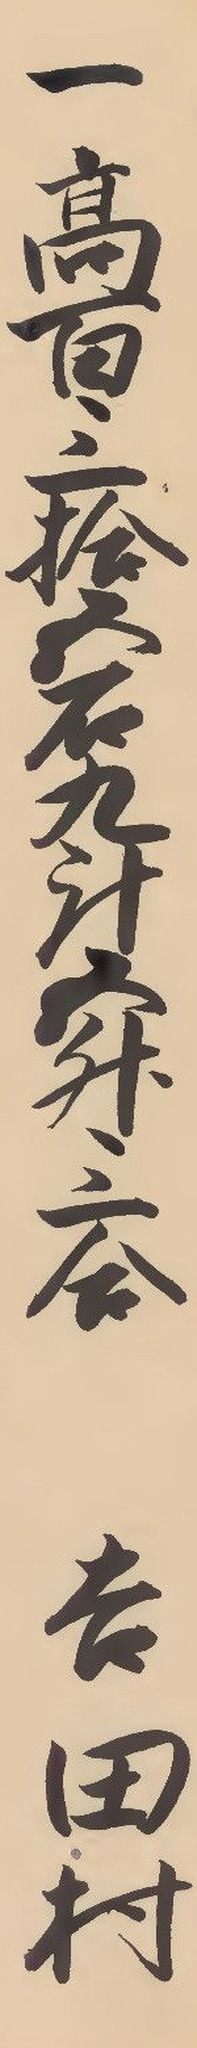一高百三拾五石九斗九升三合吉田村
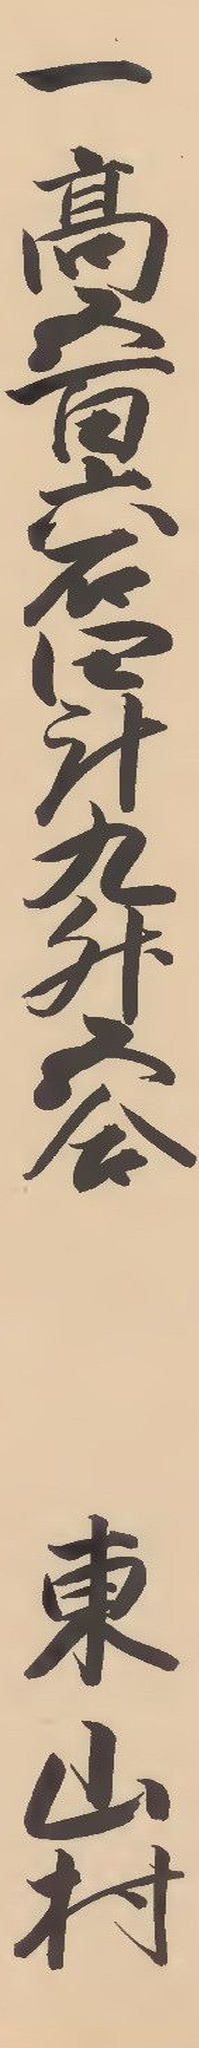一高五百六石四斗九升五合東山村
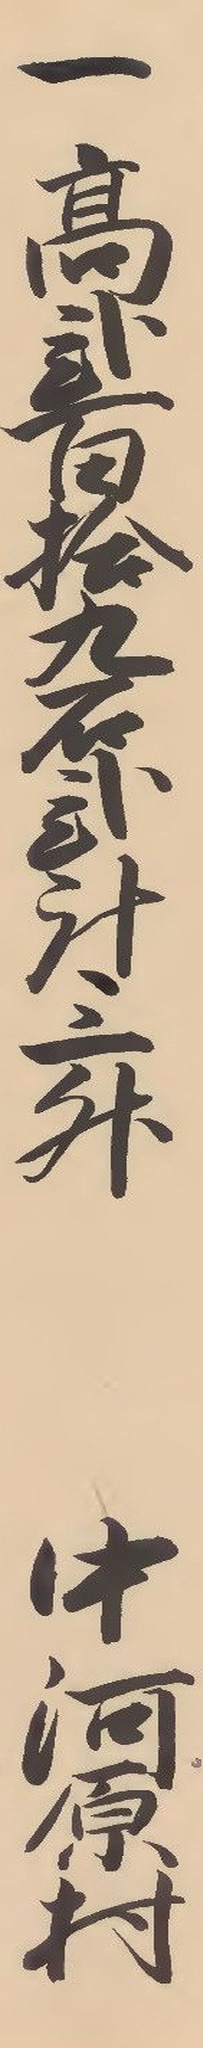一高弐百拾九石弐斗三升中河原村
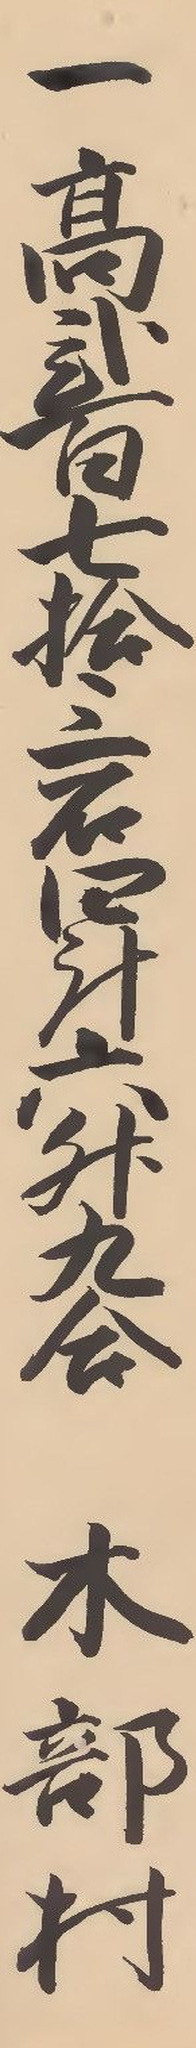一高弐百七拾三石四斗六升九合木部村
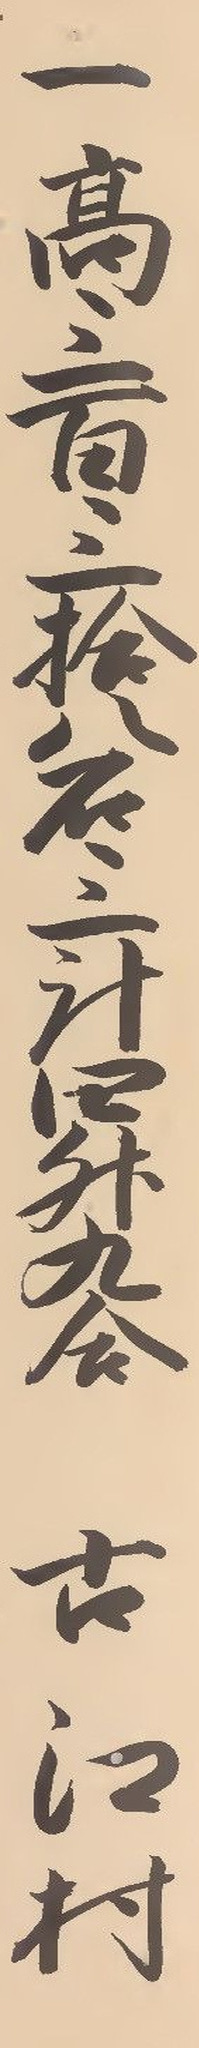一高三百三拾八石三斗四升九合古江村
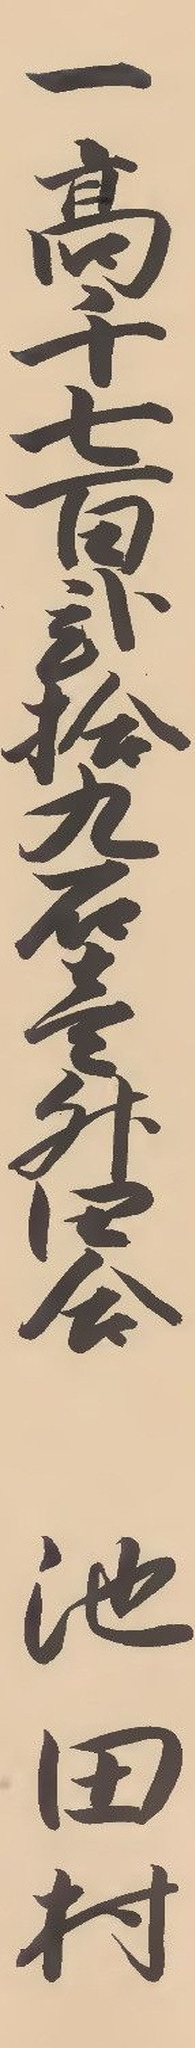一高千七百弐拾九石壱升四合池田村
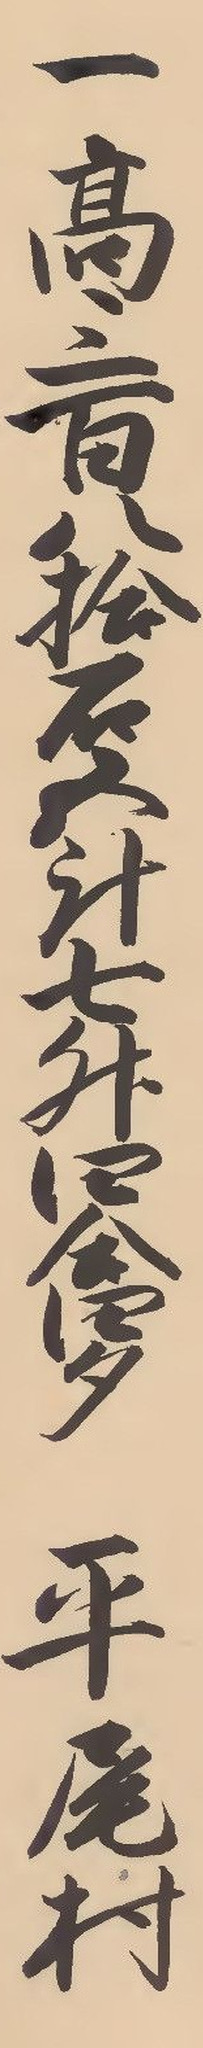一高三百八拾石五斗七升四合四勺平尾村

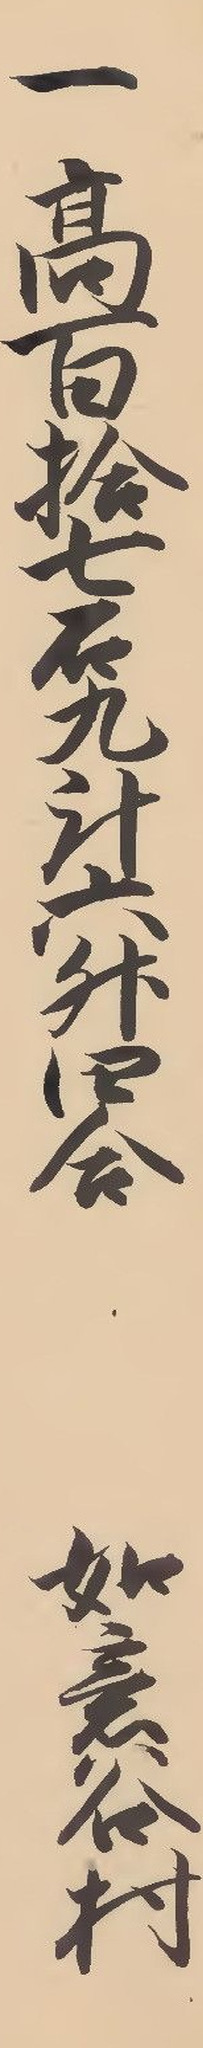一高百拾七石九斗六升四合如意谷村
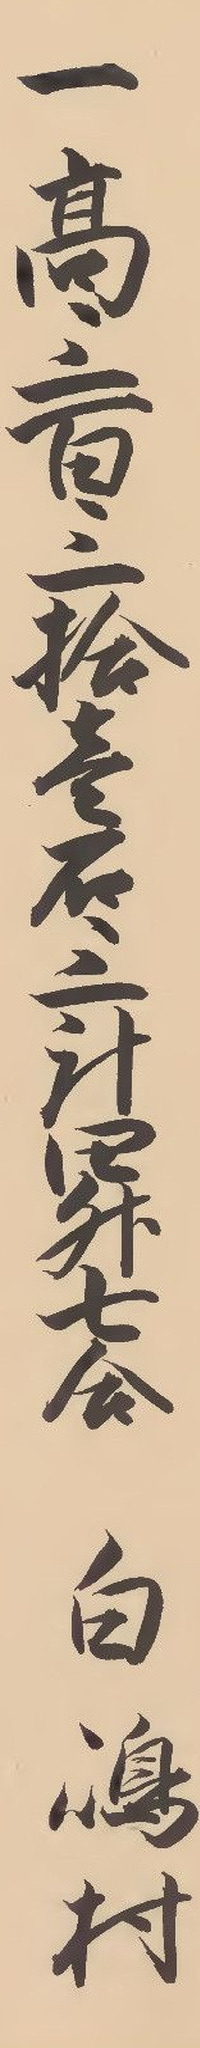一高三百三拾壱石三斗四升七合白島村
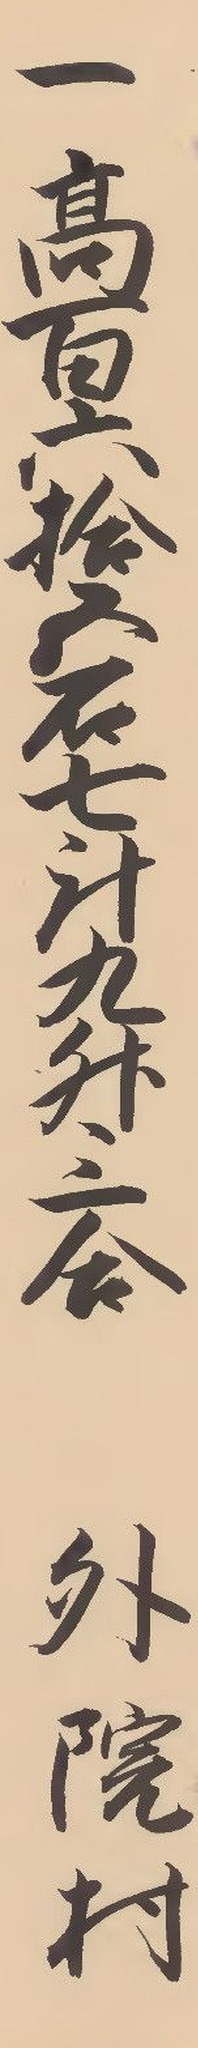一高百六拾五石七斗九升三合外院村
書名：摂津国郷帳
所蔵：国立公文書館 National Archives of Japan
